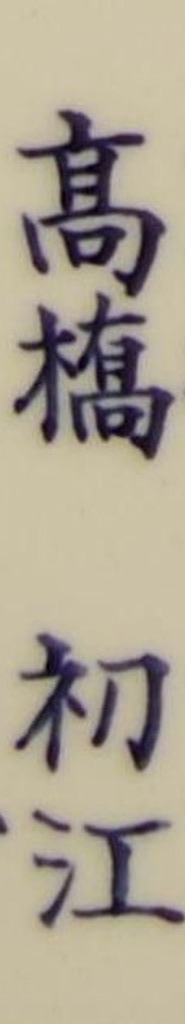高橋初江

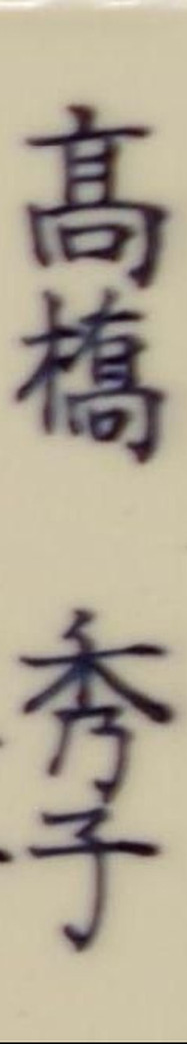高橋秀子
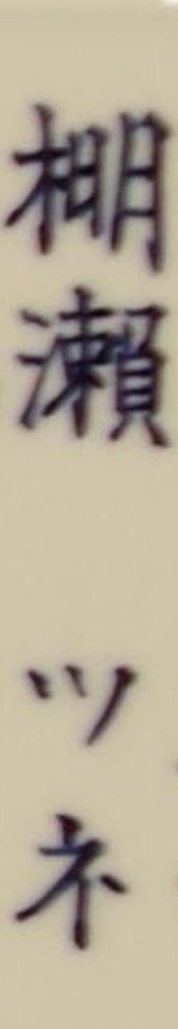棚瀬ツネ
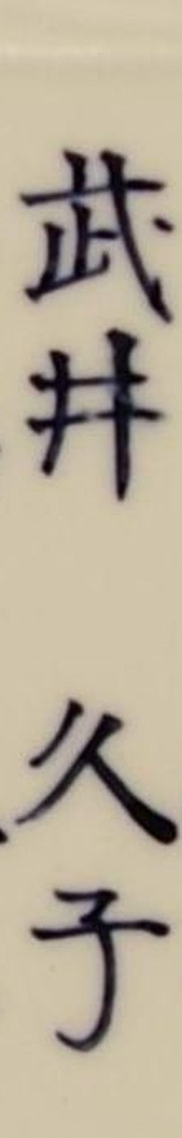武井久子
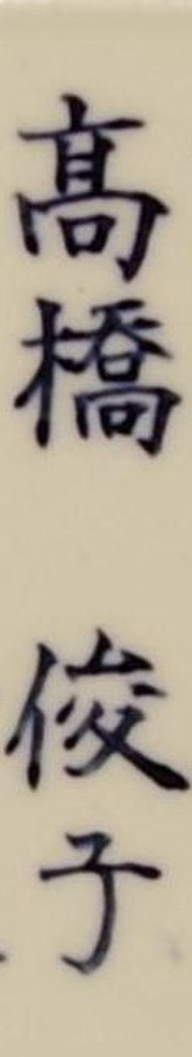高橋俊子
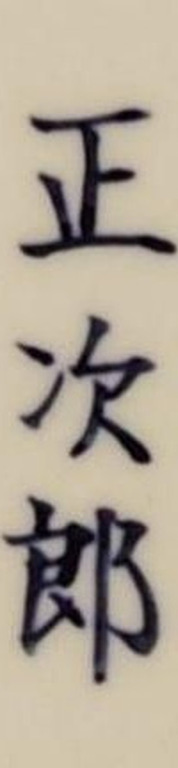正次郎
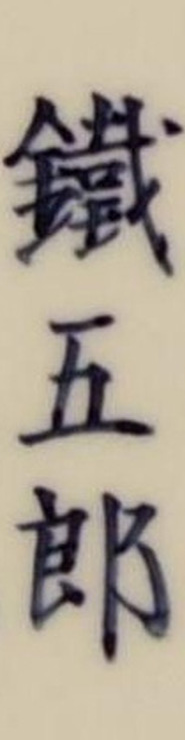鐵五郎
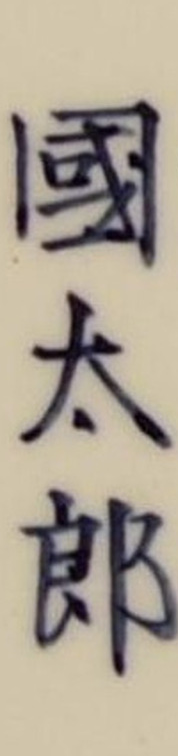國太郎
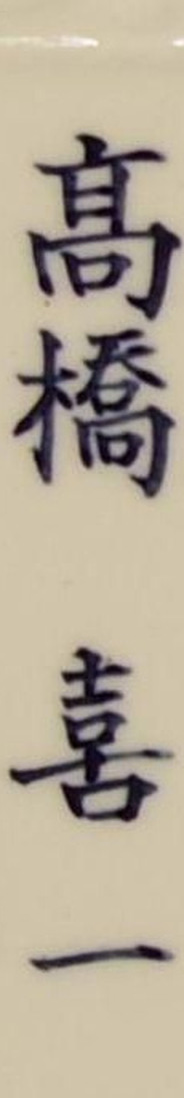高橋喜一
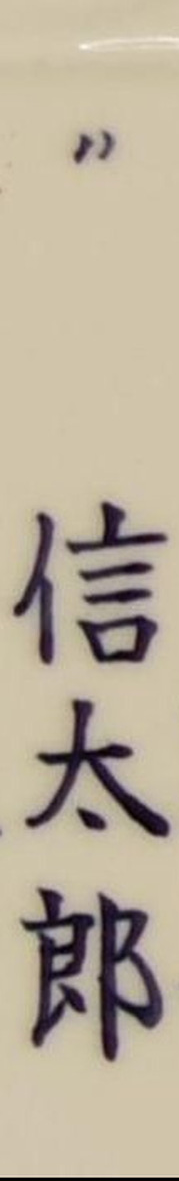信太郎
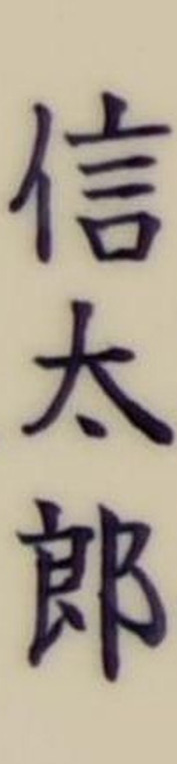信太郎

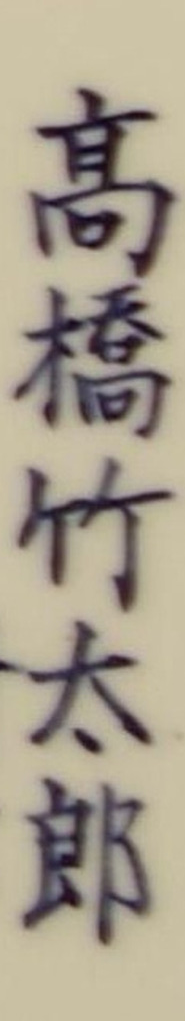高橋竹太郎
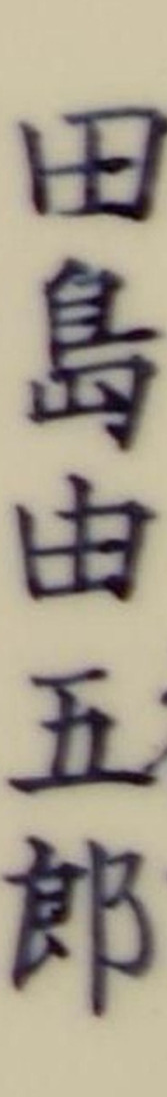田島由五郎
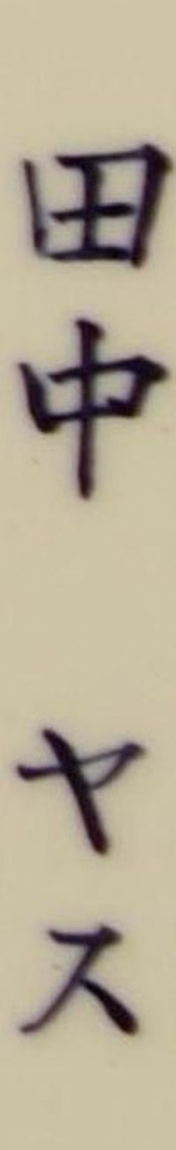田中ヤス
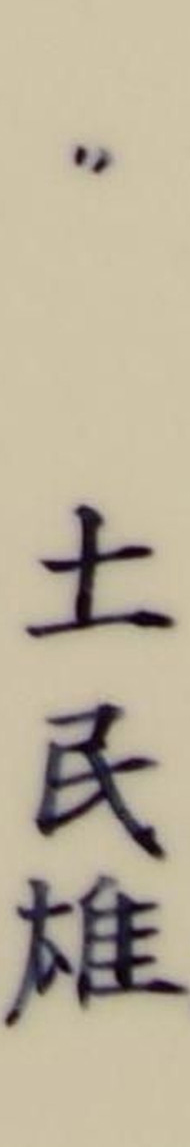土民雄
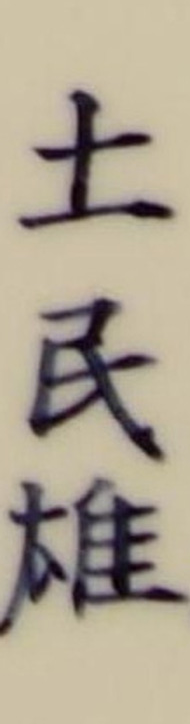土民雄
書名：E~L
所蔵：高野山金剛峯寺
